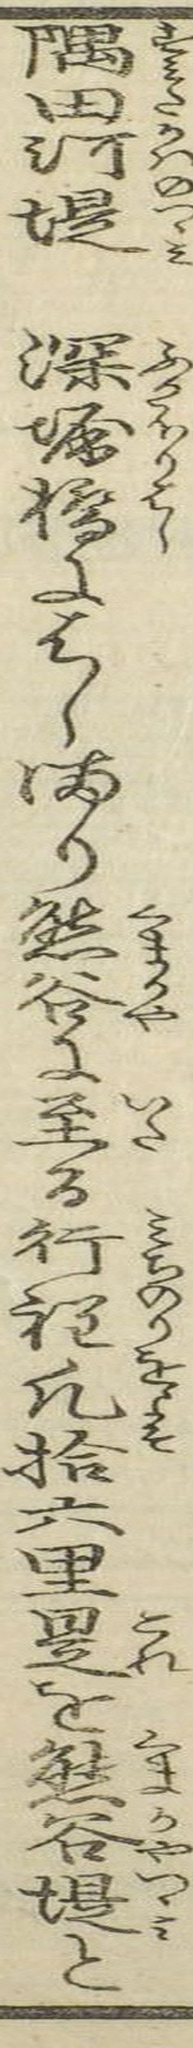隅田河堤深堀橋にはしまり態谷に至る行程凡拾六里是を熊谷堤と
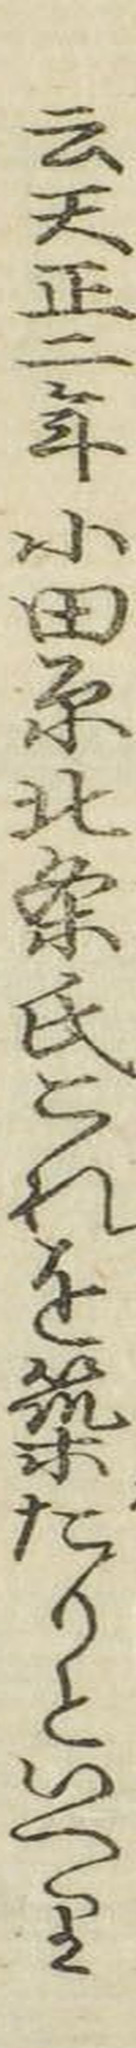云天正二年小田原北条氏これを築たりといへり
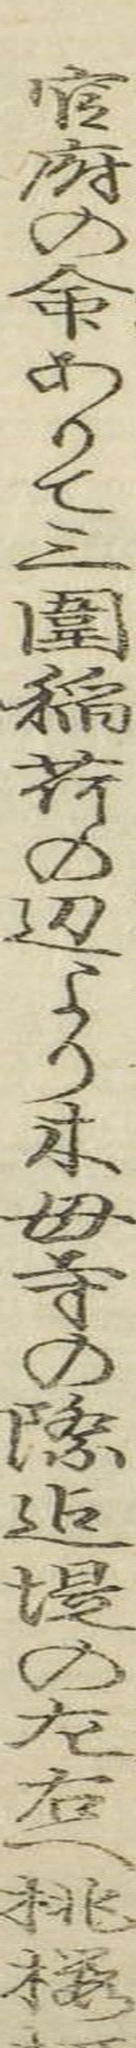官府の命ありて三囲稲荷の辺より木母寺の際迄堤の左右へ桃桜柳の
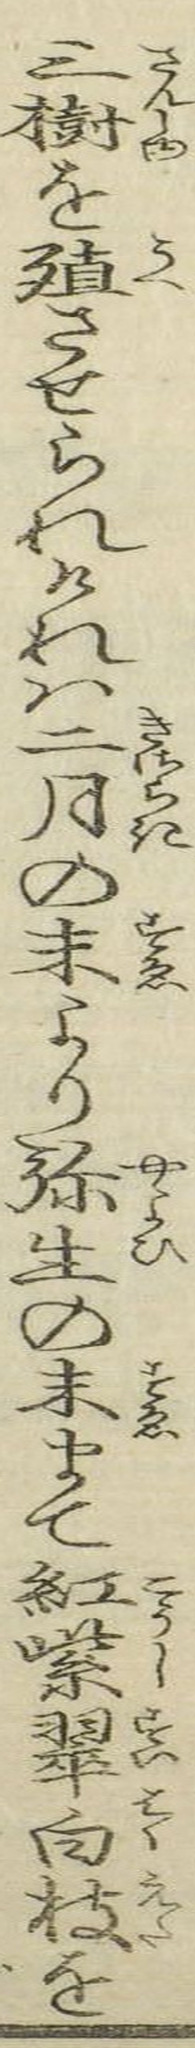三樹を殖させられけれは二月の末より弥生の末まて紅紫翠白枝を
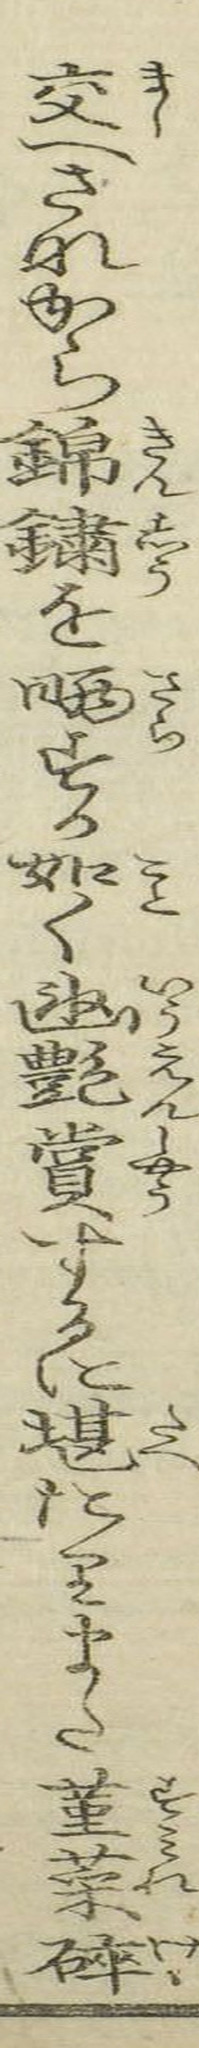交へさなから錦繍を晒すか如く幽艶賞するに堪たりまた董菜砕
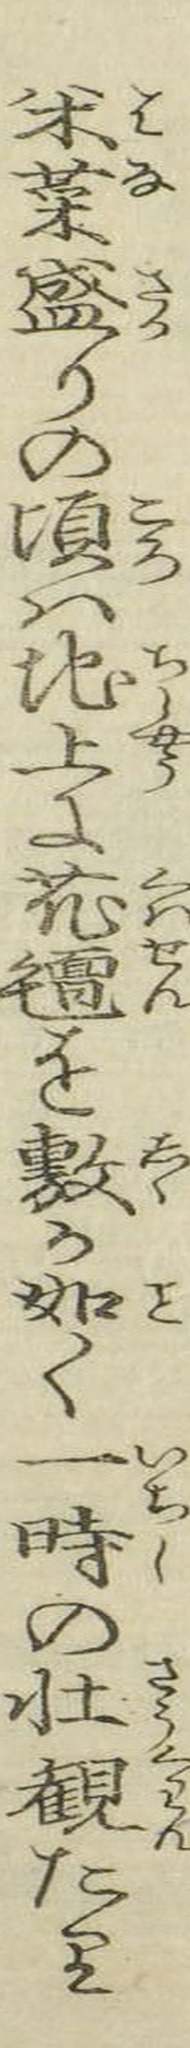米菜盛りの頃は地上に花氈を敷か如く一時の壮観たり
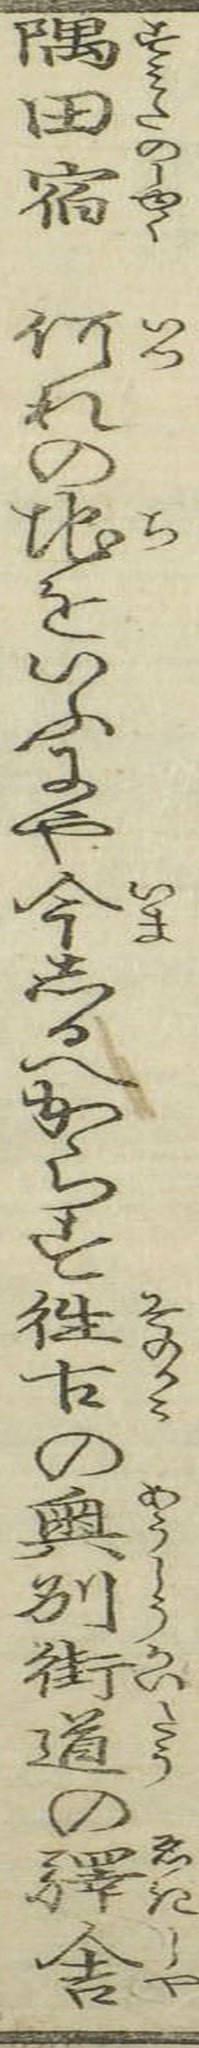隅田宿何れの地をいふにや今しるへからす往古の奥州街道の駅舎
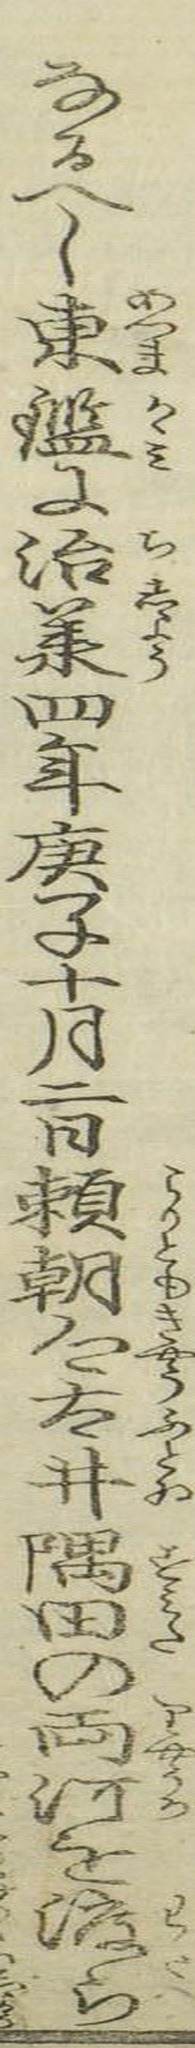なるへし東鑑に治承四年庚子十月二日頼朝卿太井隅田の両河を渡ら

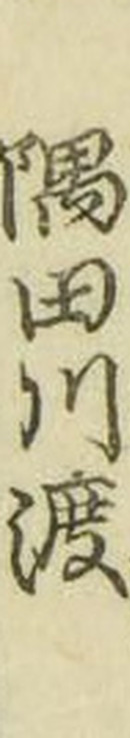隅田川渡
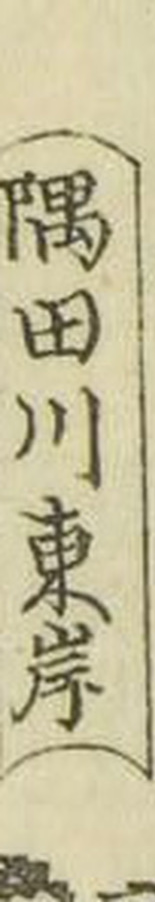隅田川東岸
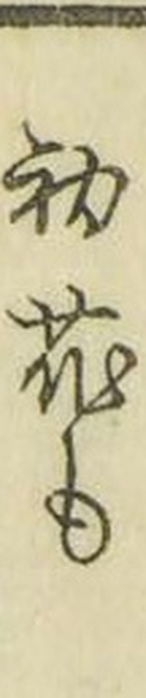初花も
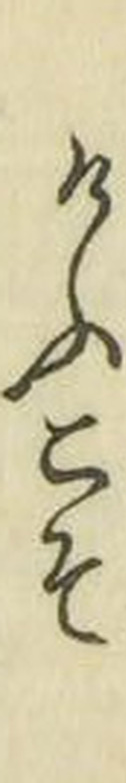けふこそ
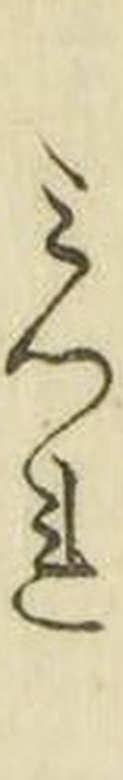みつれ
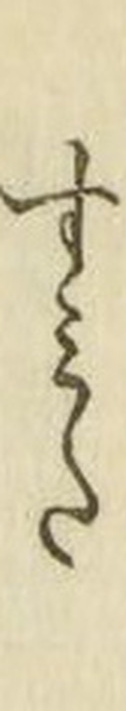すみた
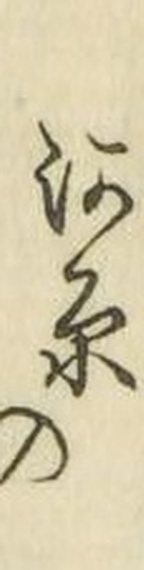河原の
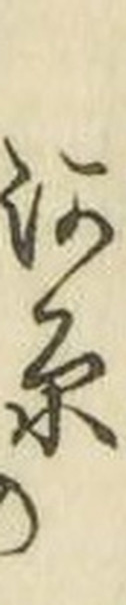河原の
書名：江戸名所図会 20巻 巻之19
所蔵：東京学芸大学教育コンテンツアーカイブ
